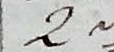2
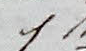1
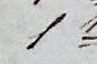1
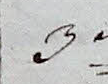3
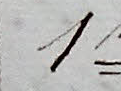1
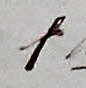1
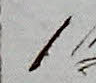1
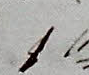1
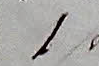1
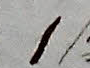1
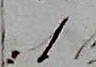1
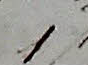1.
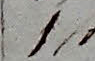1.
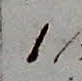1
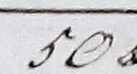50
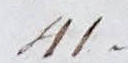41
